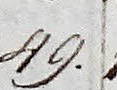49.
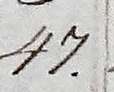47.
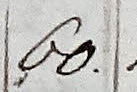60.
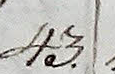43.
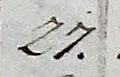27.
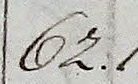62.
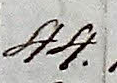44.
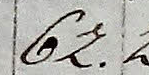62.
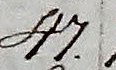47.
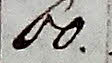60.
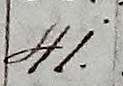41.
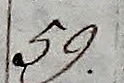59.
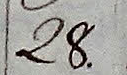28.
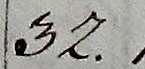32.
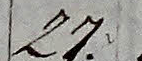27.
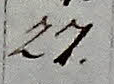27.
